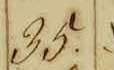35.
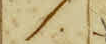1.
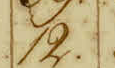12.
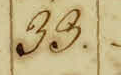33.
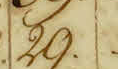29.
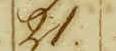21.
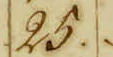25.
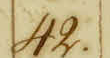42.
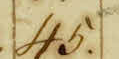45.
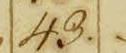43.
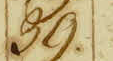39.
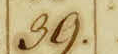39.
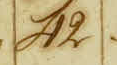42
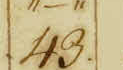43.
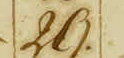29.
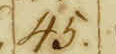45.
